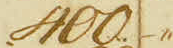400.
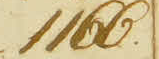1166.
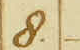8.
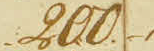200.
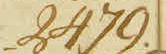2479.
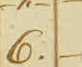6.
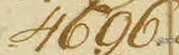4696.
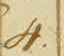4.
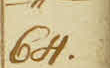64.
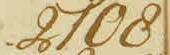2108.
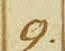9.
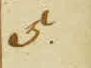5.
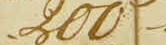200
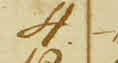4.
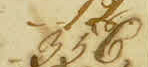356.
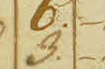3.
